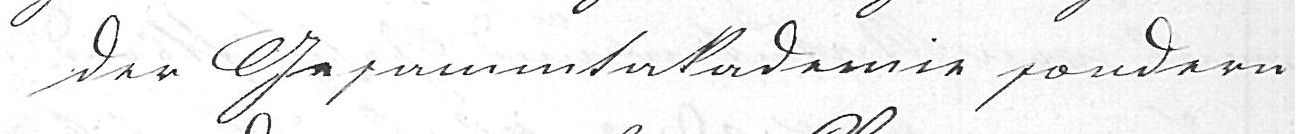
der Gesammtakademie sondern
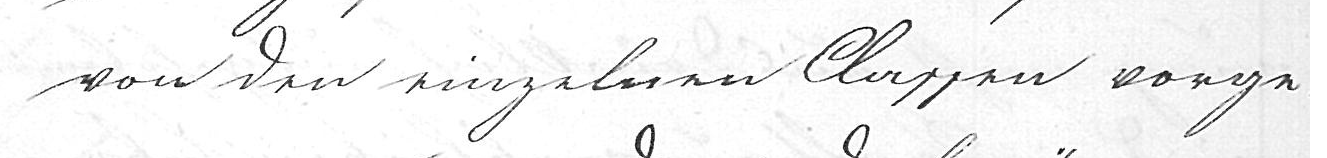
von den einzelnen Classen vorge-
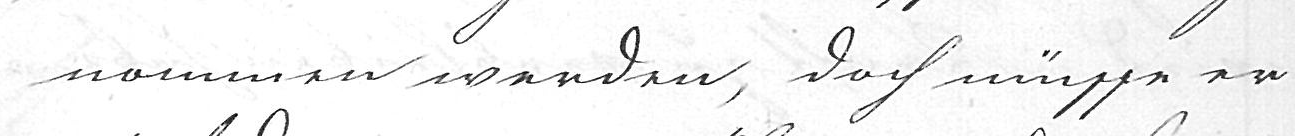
nommen wenden, doch müsse er
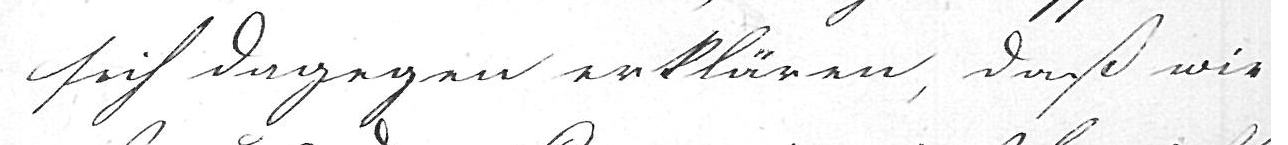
sich dagegen erklären, daß wie
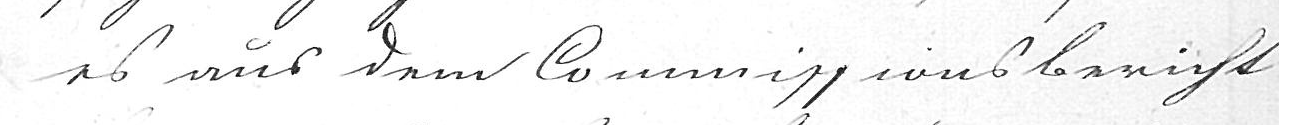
es aus dem Commissonsbericht
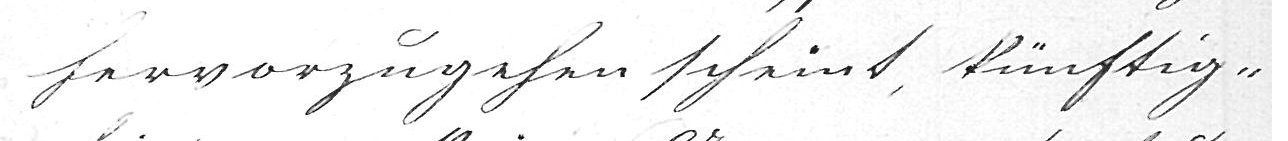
hervorzugehen scheint, künftig-
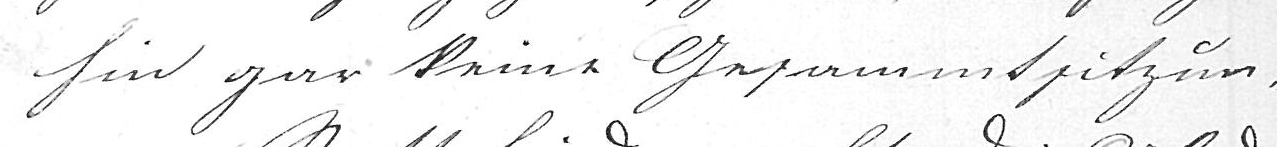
hin gar keine Gesammtsitzun-
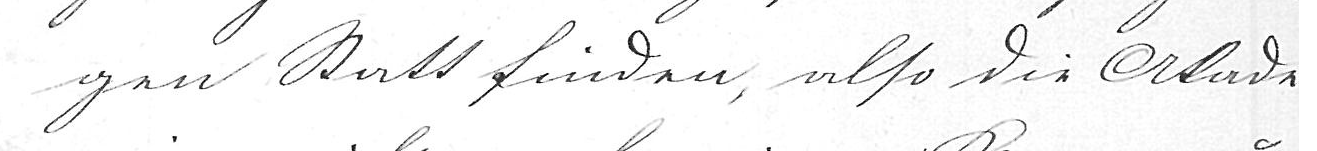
gen Statt finden, also die Akade-
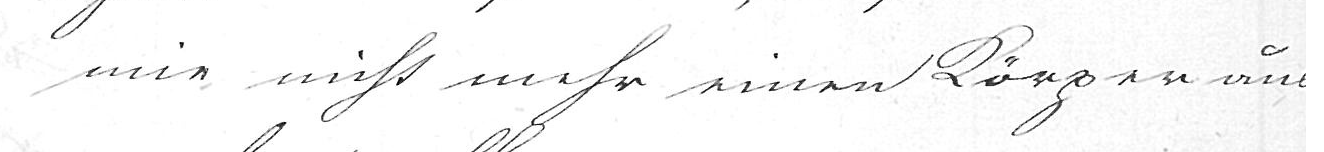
mie nicht mehr einen Körper aus-
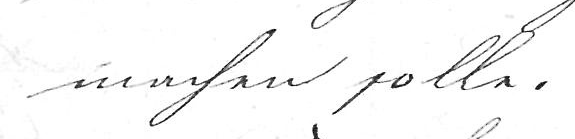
machen solle.
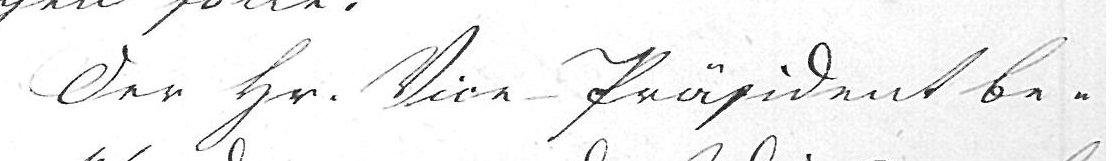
Der Hr. Vice-Präsident be-
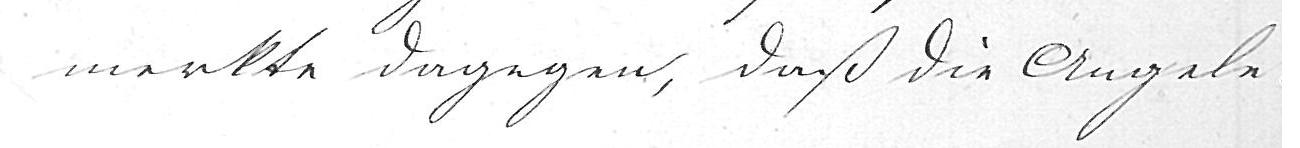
merkt dagegen, daß die Angabe
